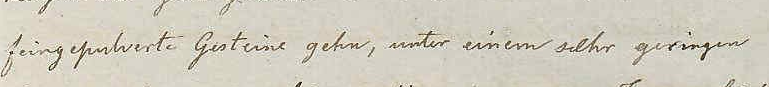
feingepulverte Gesteine gehn, unter einem sehr geringen
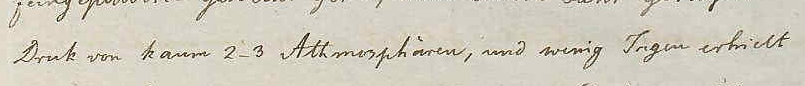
Druk von kaum 2–3 Athmosphären, und wenig Tagen erhielt
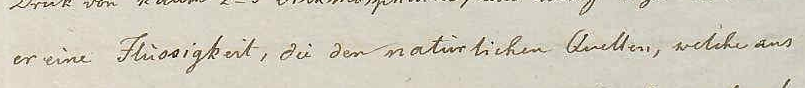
er eine Flüssigkeit, die den natürlichen Quellen, welche aus
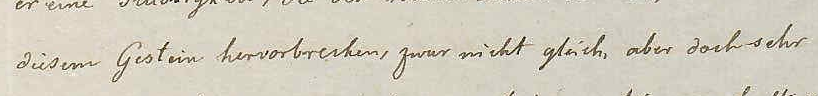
diesem Gestein hervorbrechen, zwar nicht gleich aber doch sehr
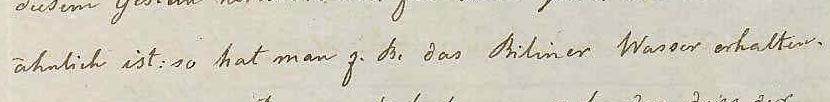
ähnlich ist: so hat man z. B. das Biliner Wasser erhalten,
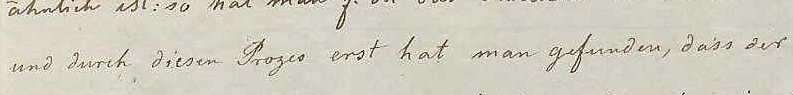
und durch diesen Prozes erst hat man gefunden, dass der
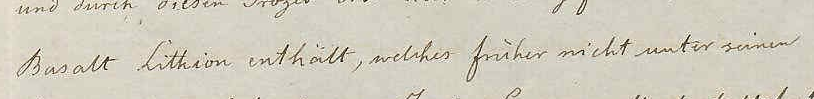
Basalt Lithion enthält, welches früher nicht unter seinen
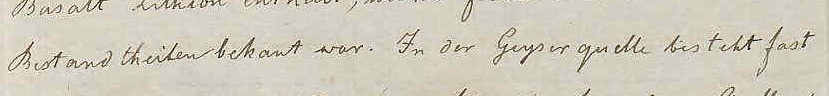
Bestandtheilen bekant war. In der Geyserquelle besteht fast
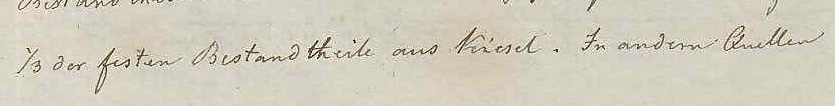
⅓ der festen Bestandtheile aus Kiesel. In andern Quellen
